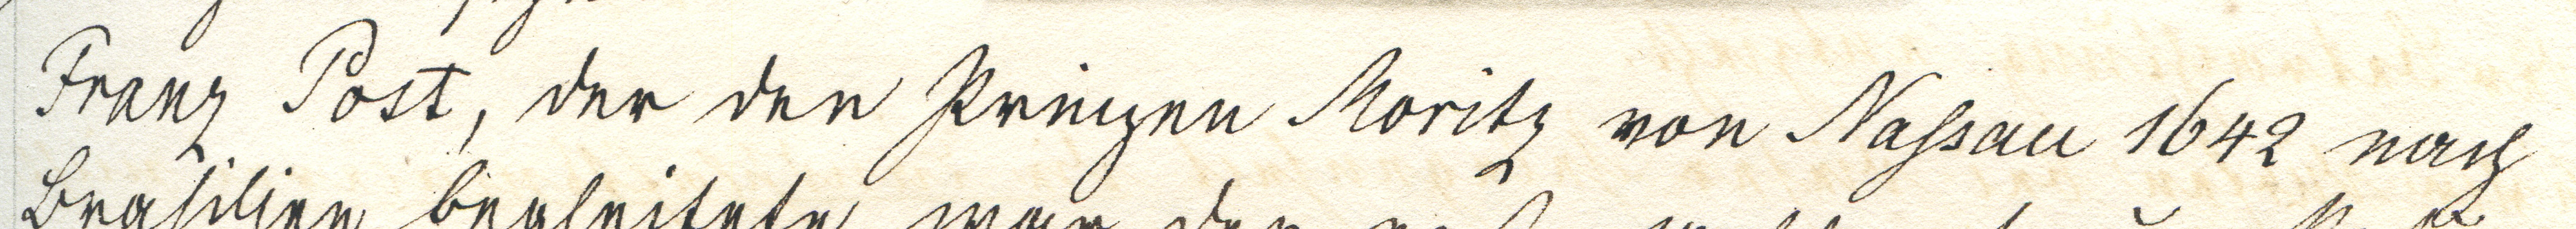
Franz Post, der den Prinzen Moritz von Nassau 1642 nach
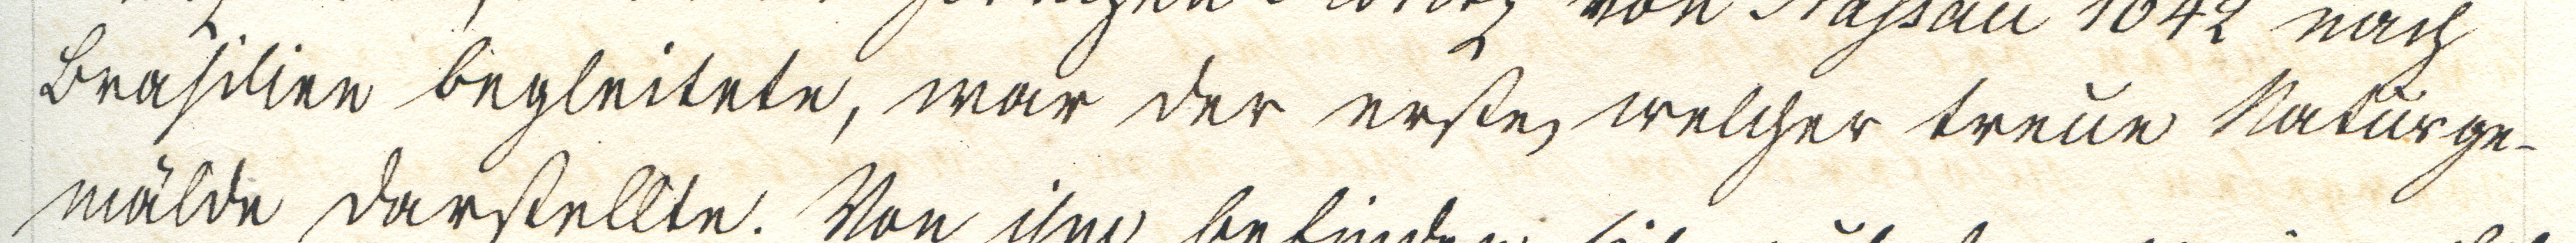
Brasilien begleitete, war der erste, welcher treue Naturge-
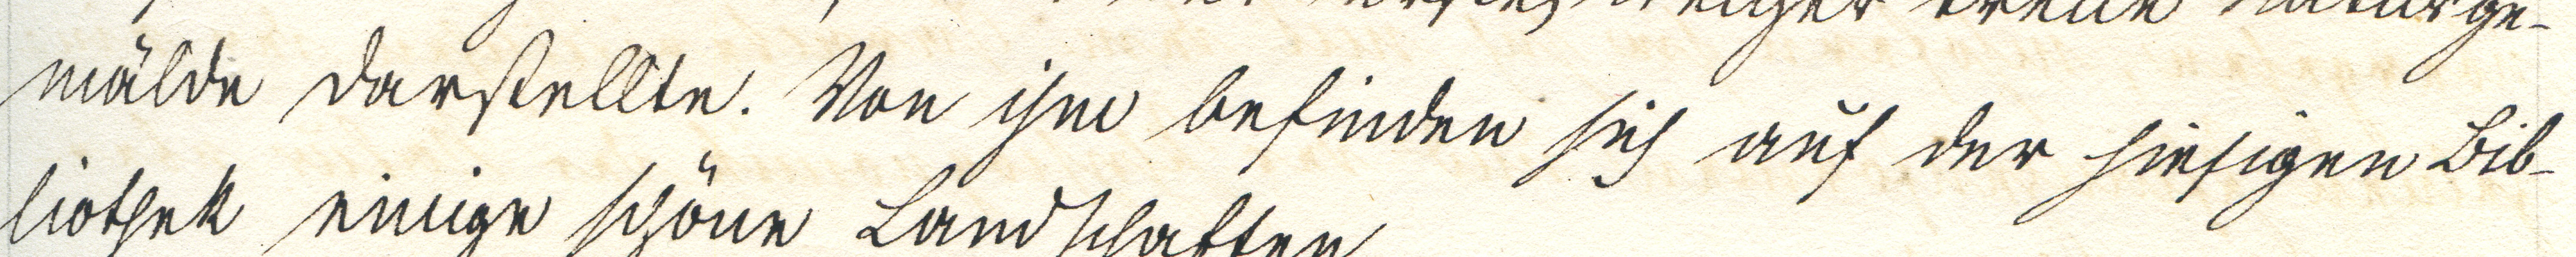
mälde darstellte. Von ihm befinden sich auf der hiesigen Bib-
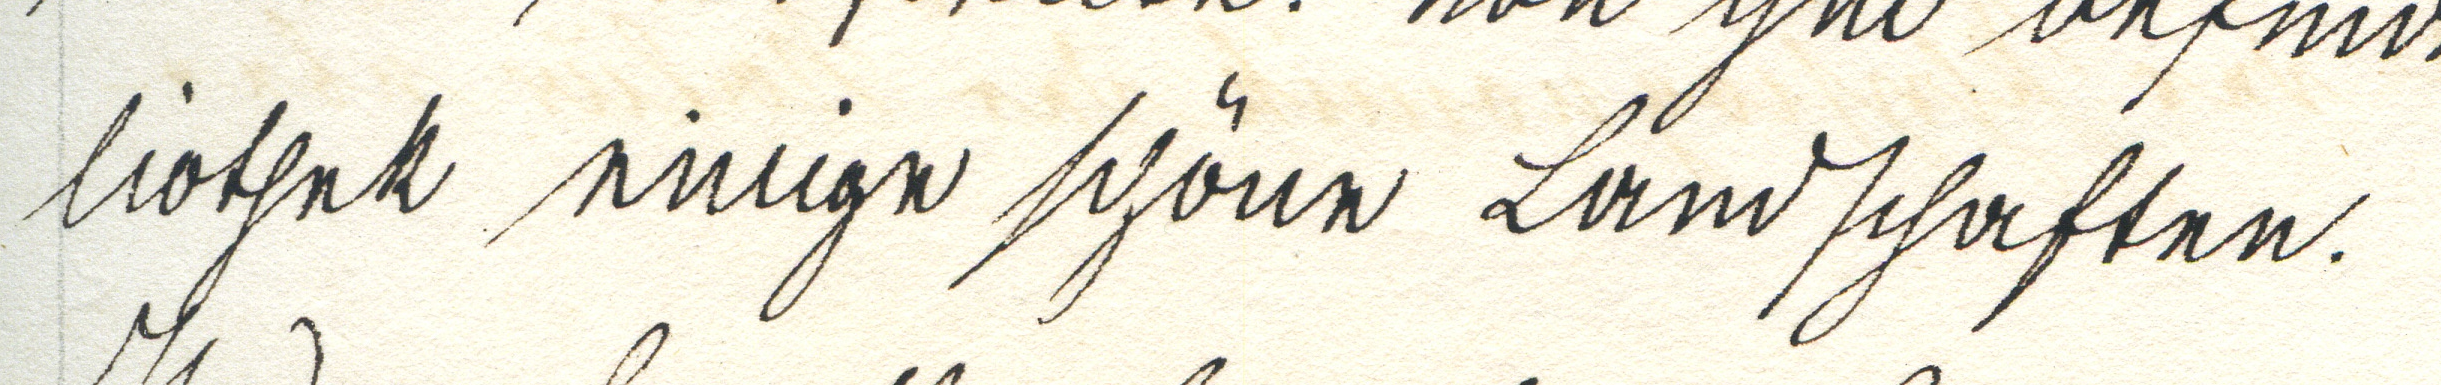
liothek einige schöne Landschaften.
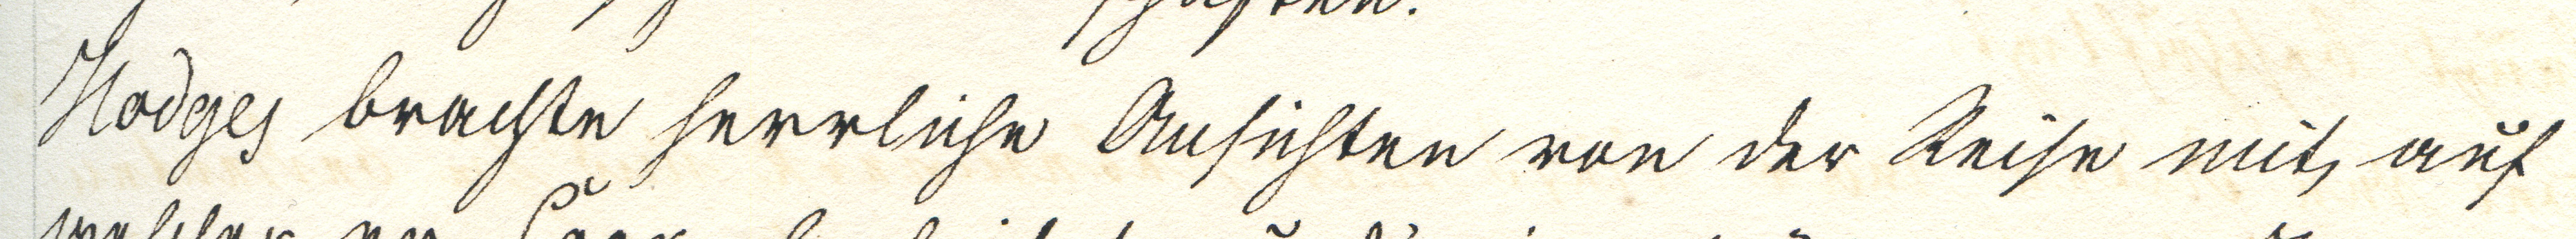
Hodges brachte herrliche Ansichten von der Reise mit, auf
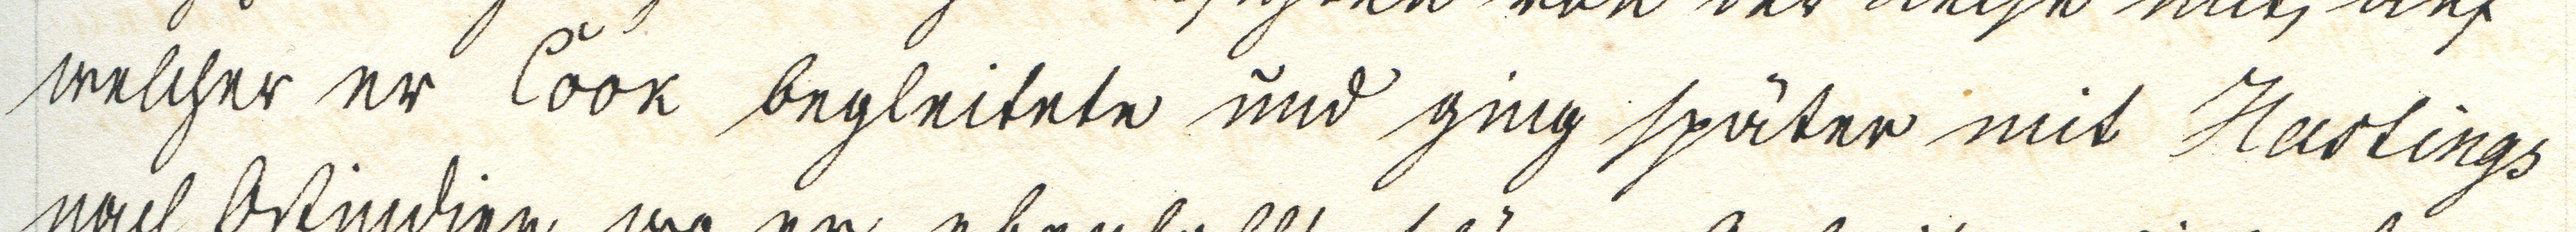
welcher er Cook begleitete und ging später mit Hastings
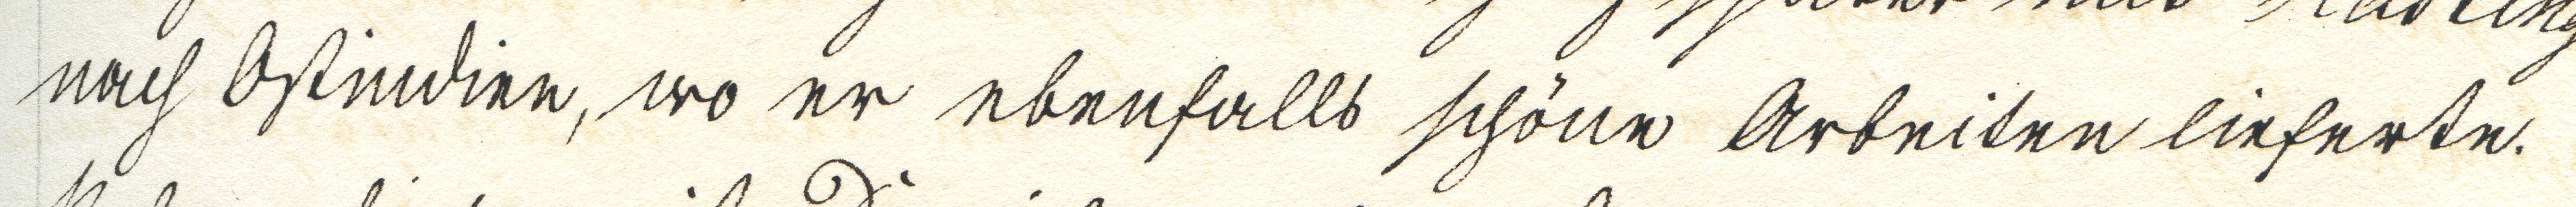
nach Ostindien, wo er ebenfalls schöne Arbeiten lieferte.
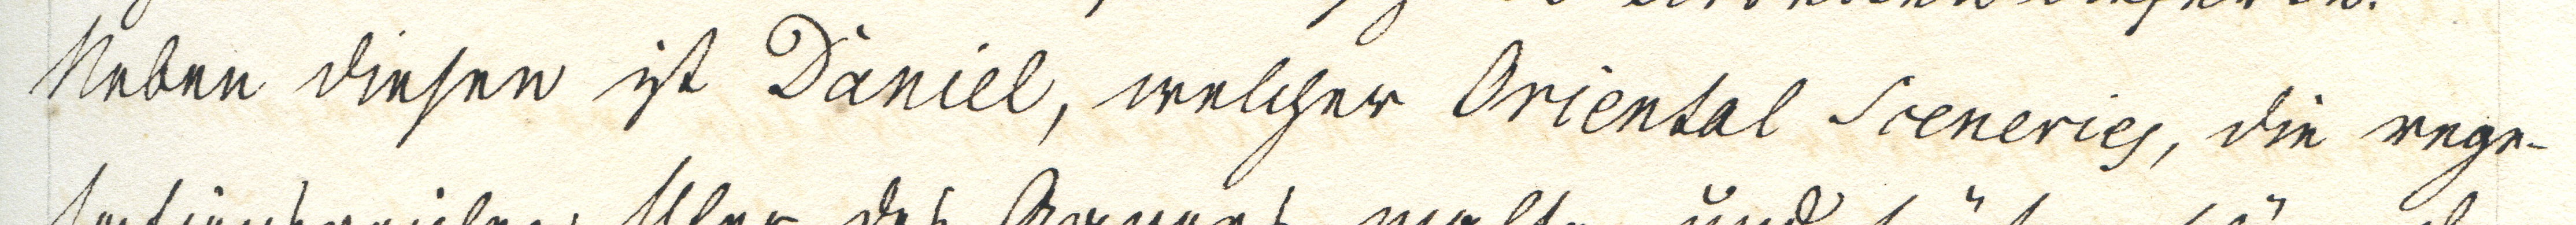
Neben diesen ist Daniel, welcher Oriental Sceneries, die vege-
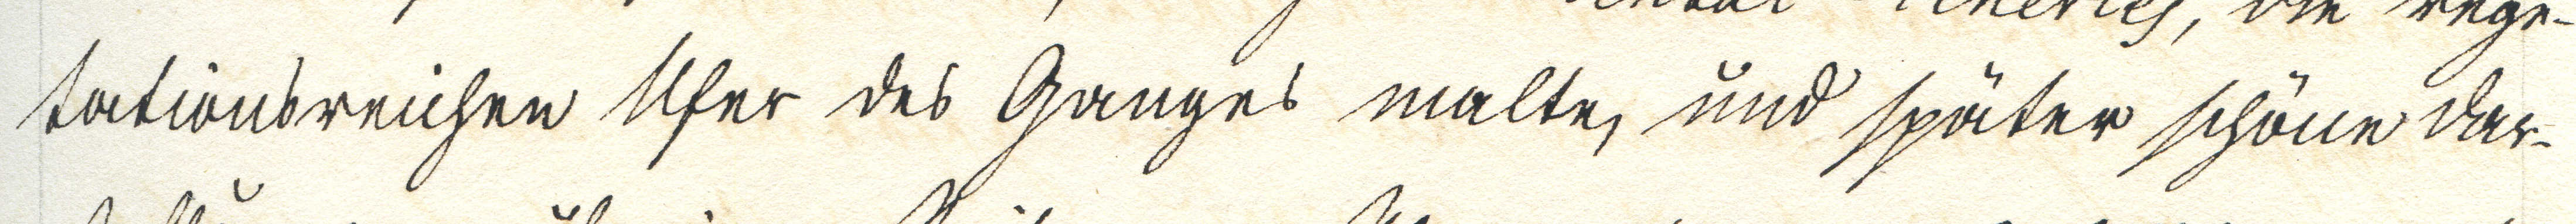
tationsreichen Ufer des Ganges malte, und später schöne Dar-
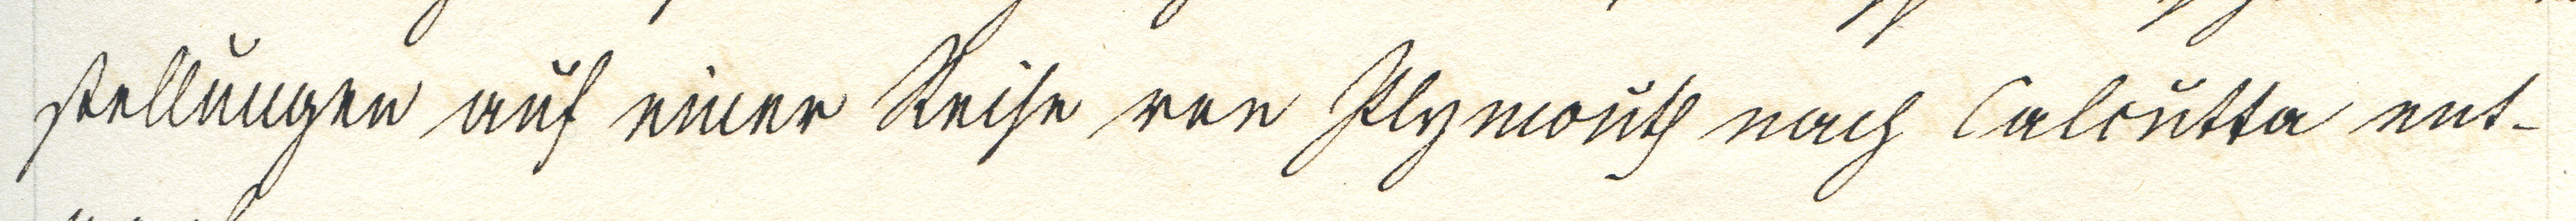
stellungen auf seiner Reise von Plymouth nach Calcutta ent-
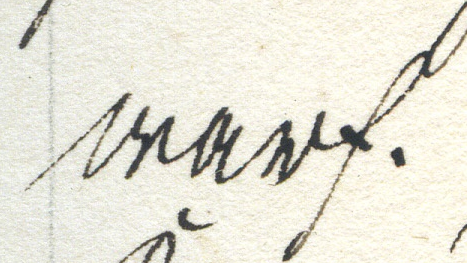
warf.
